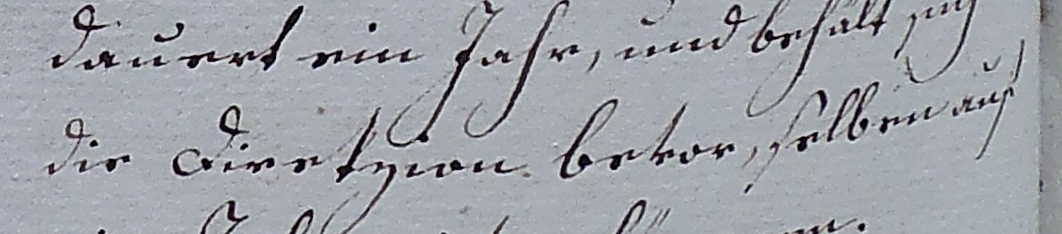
die Direkzion bevor, selben auf
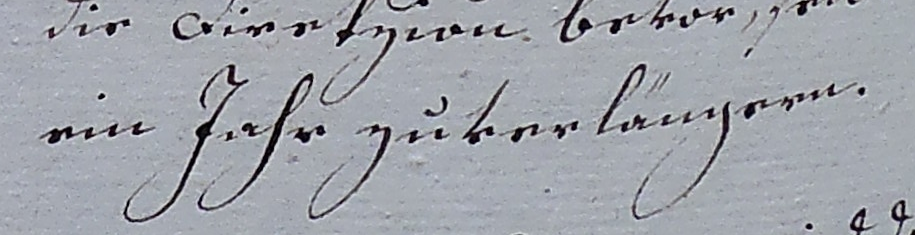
ein Jahr zuverlängern.
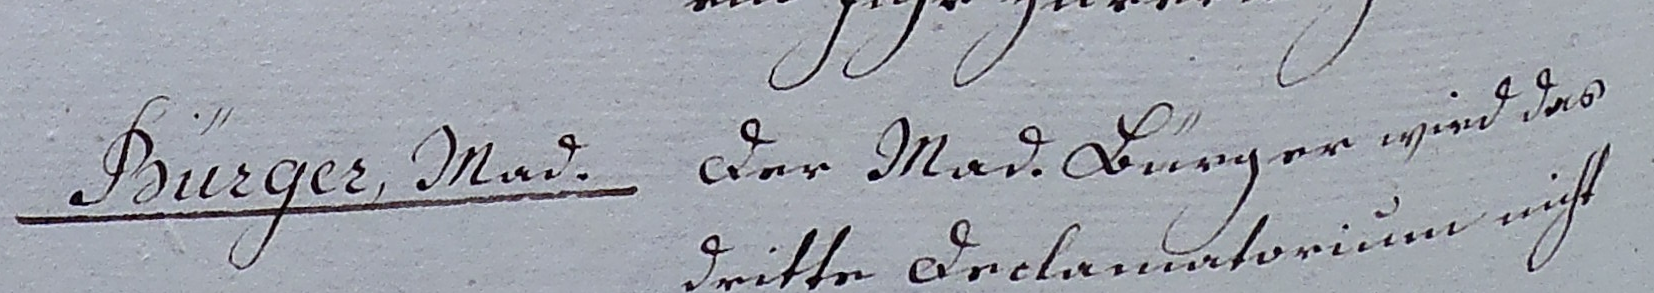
Bürger, Mad. Der Mad. Bürger wird das
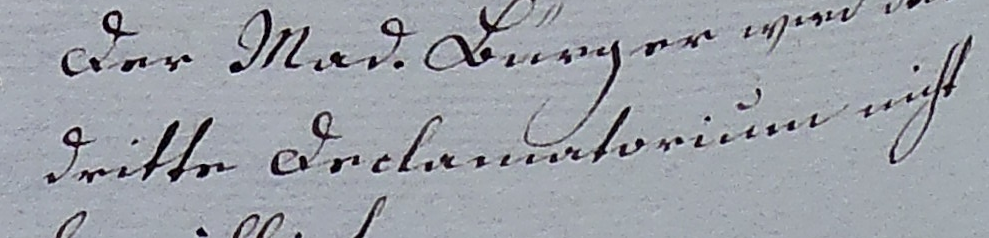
dritte Declamatorium nicht
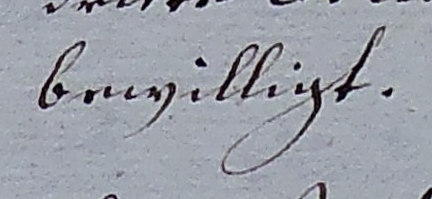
bewilligt.
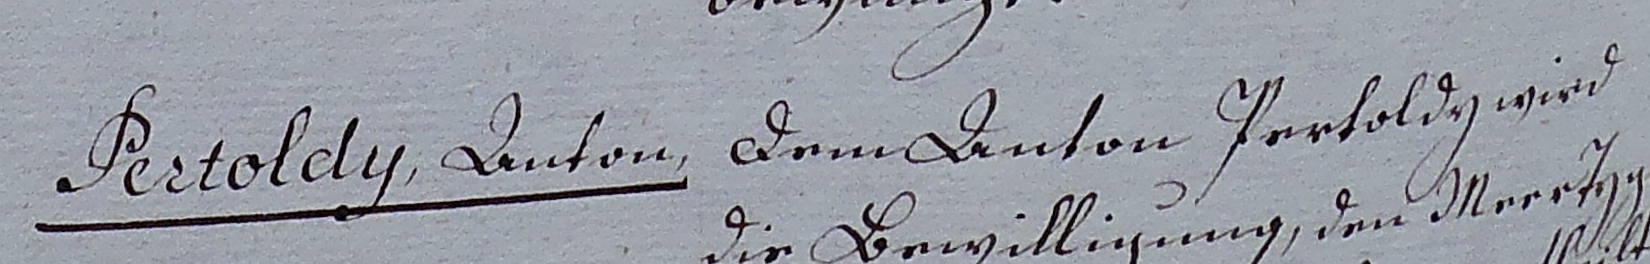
Pertoldy, Anton, Dem Anton Pertoldy wird
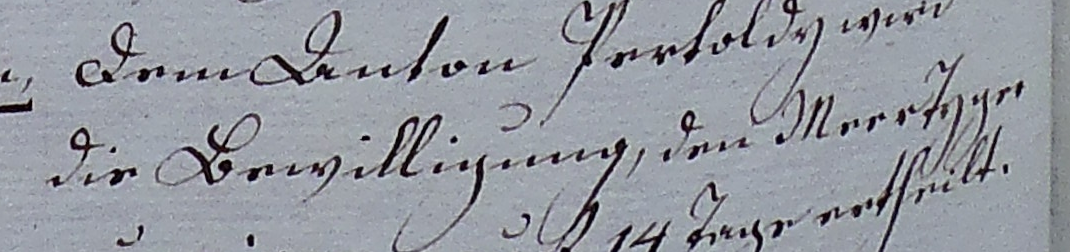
die Bewilligung, den Meertzger
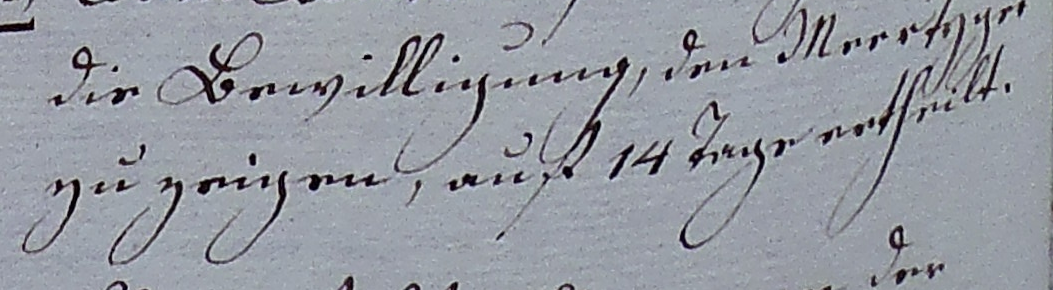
zu zeigen, auf 14 Tage ertheilt.
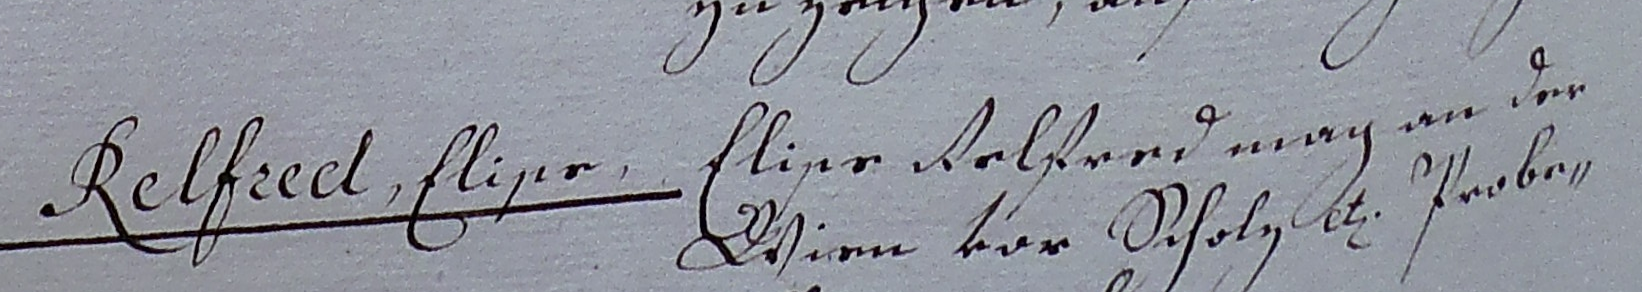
Relfred, Elise, Elise Relfred mag an der
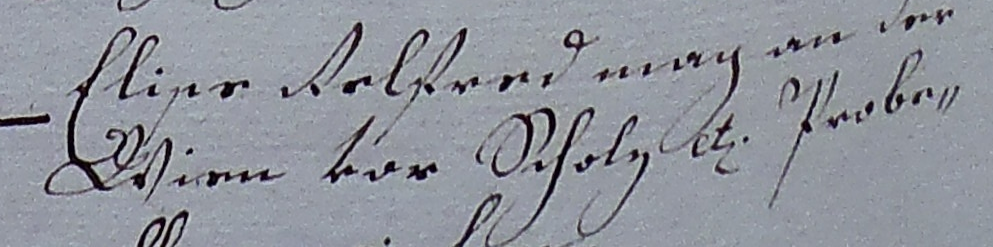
Wien vor Scholz etc Probe¬
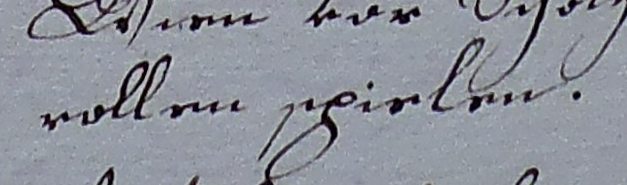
rollen spielen.
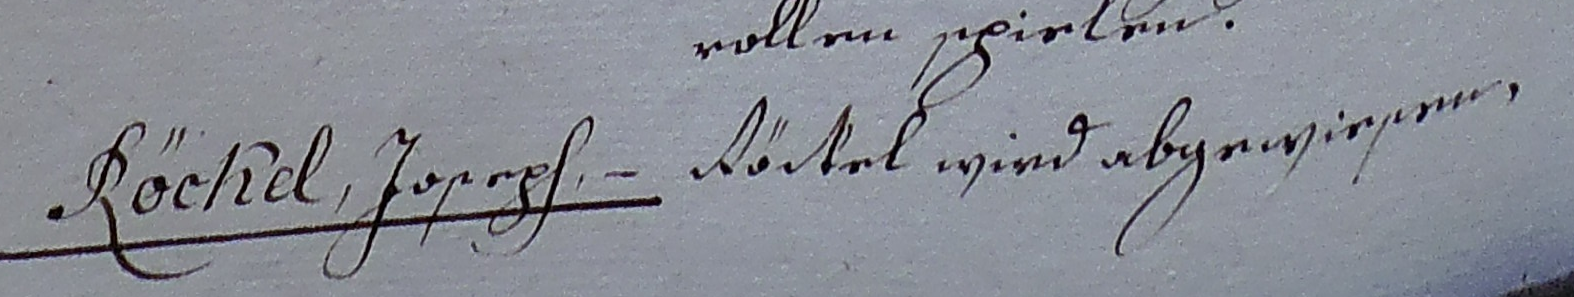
Röckel, Joseph, .. Röckel wird abgewiesen.
